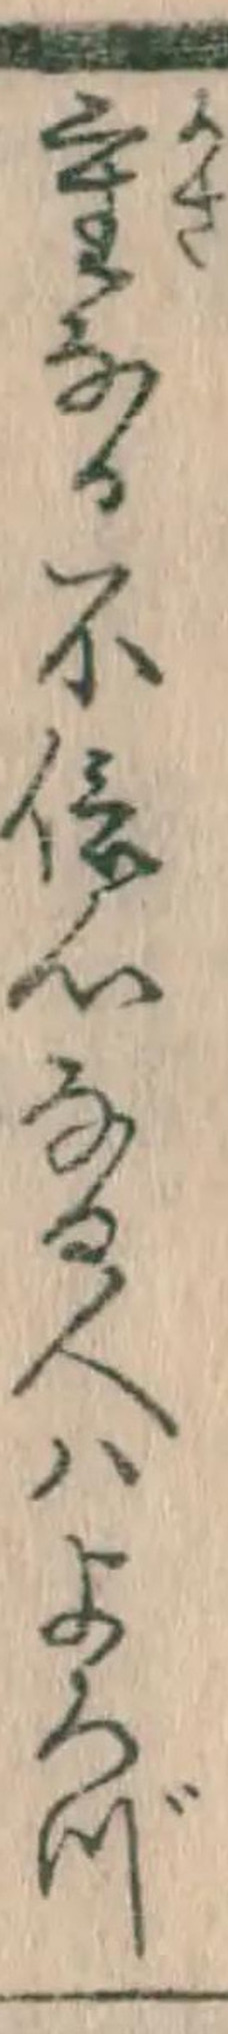重なる不信心なる人はよろづ
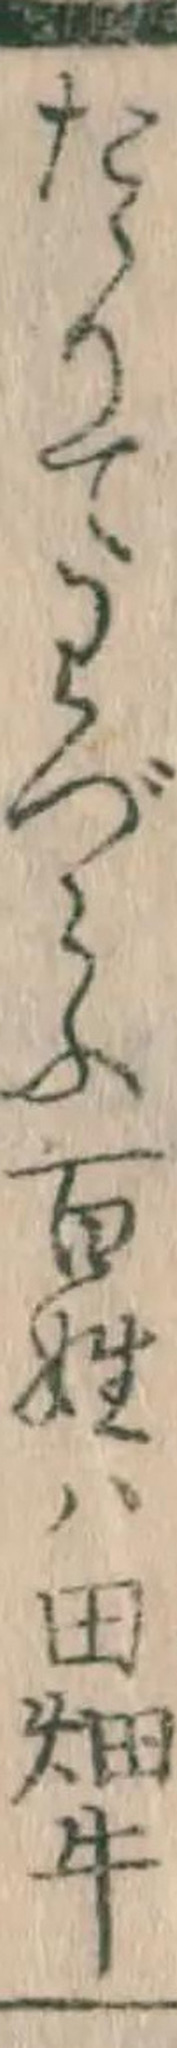たゝりてわづらふ百姓は田畑牛
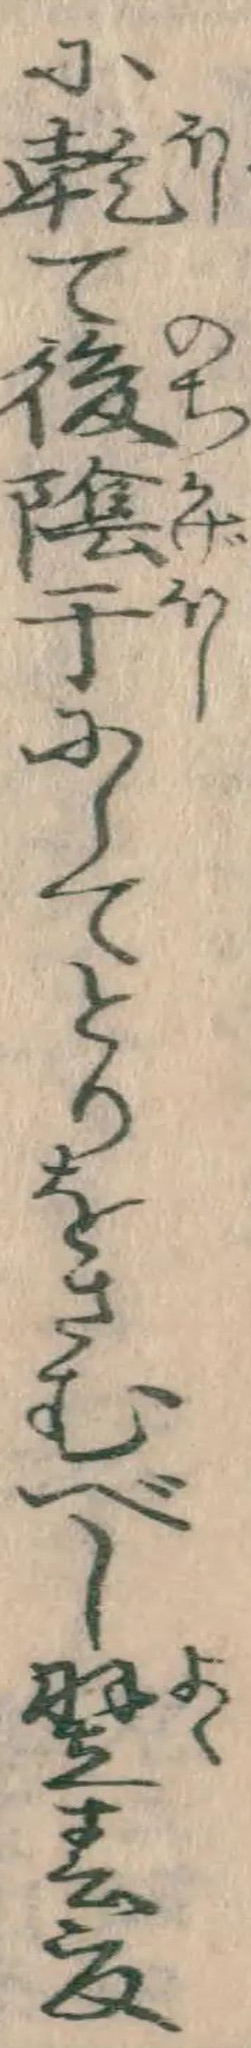に乾て後陰干にしてとりをさむべし翌春夏
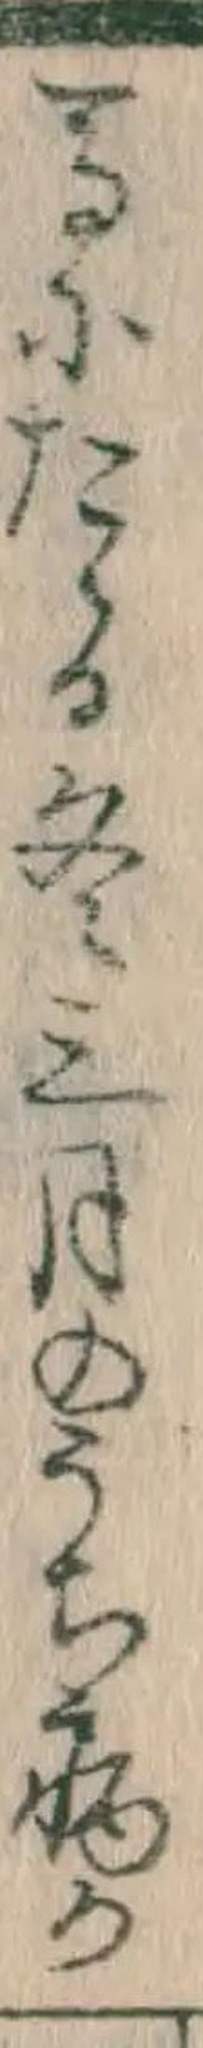馬にたゝる冬三月のうち病か
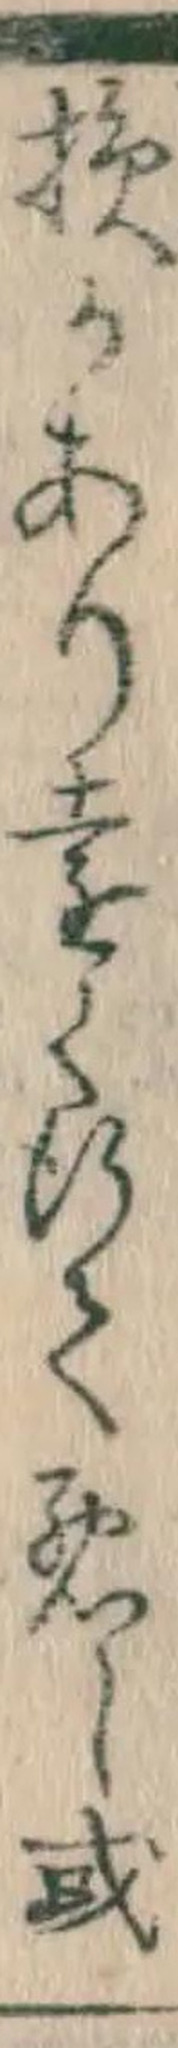損かあり遠く行て悪し或
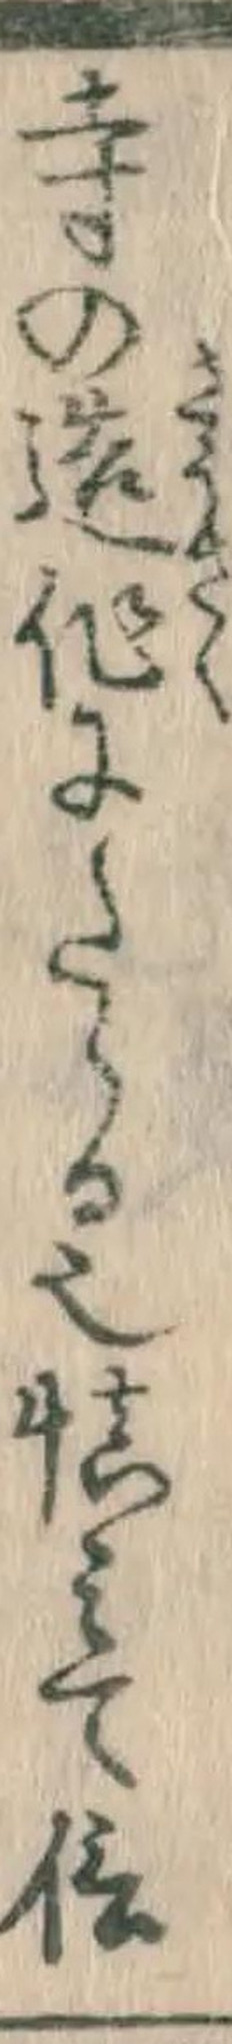寺の造作にたゝる也慎みて信
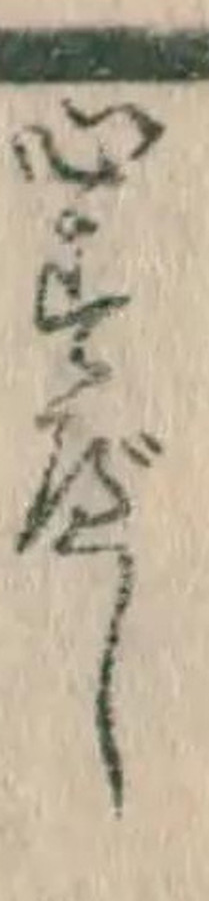心すべし
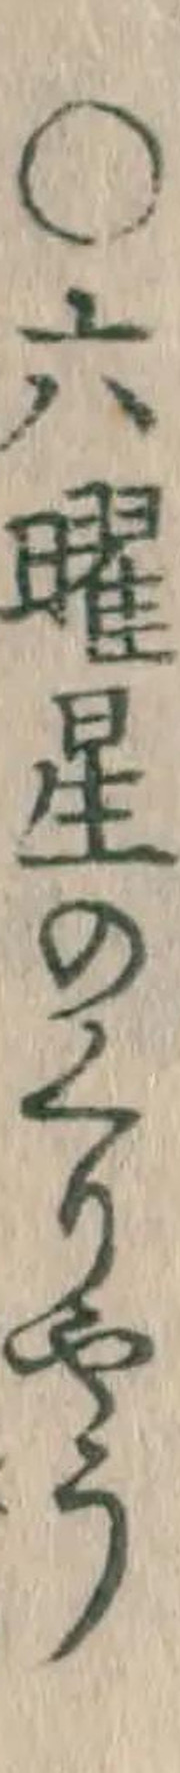○六曜星のくりやう
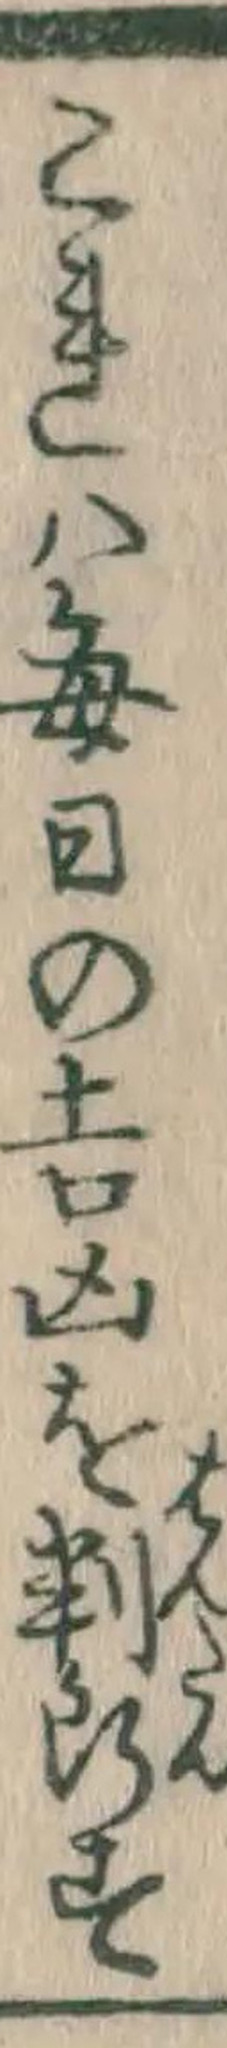これは毎日の吉凶を判断す
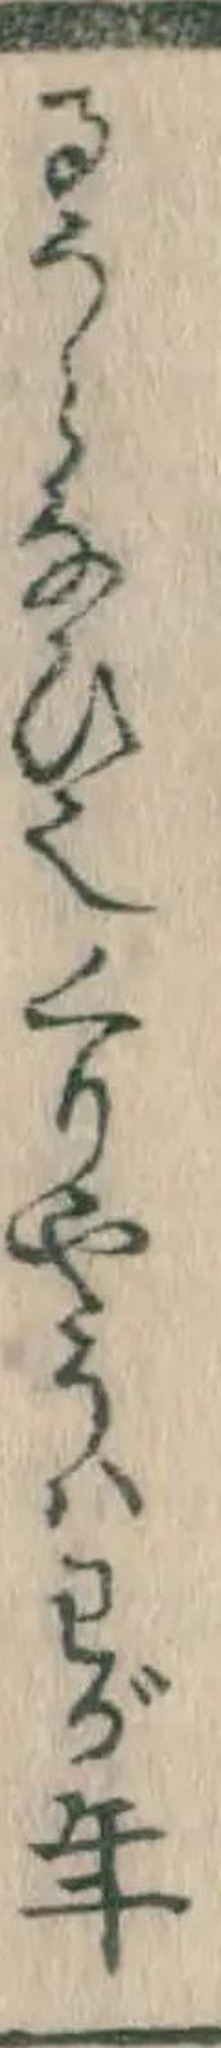るうらなひ也くりやうはわが年
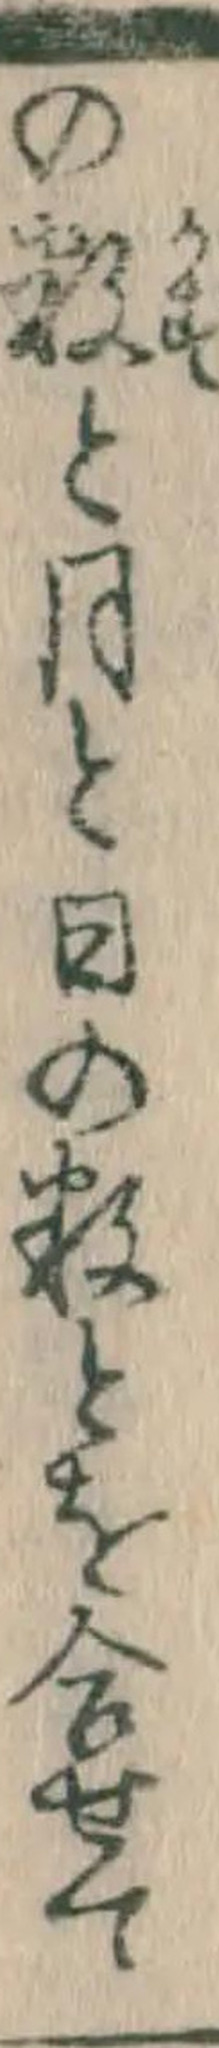の数と月と日の数とを合せて

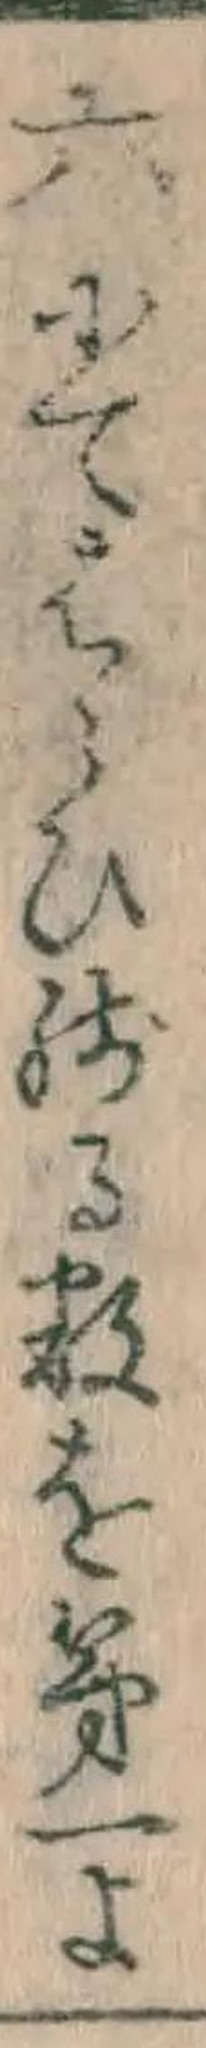六にてはらひ残る数を第一よ
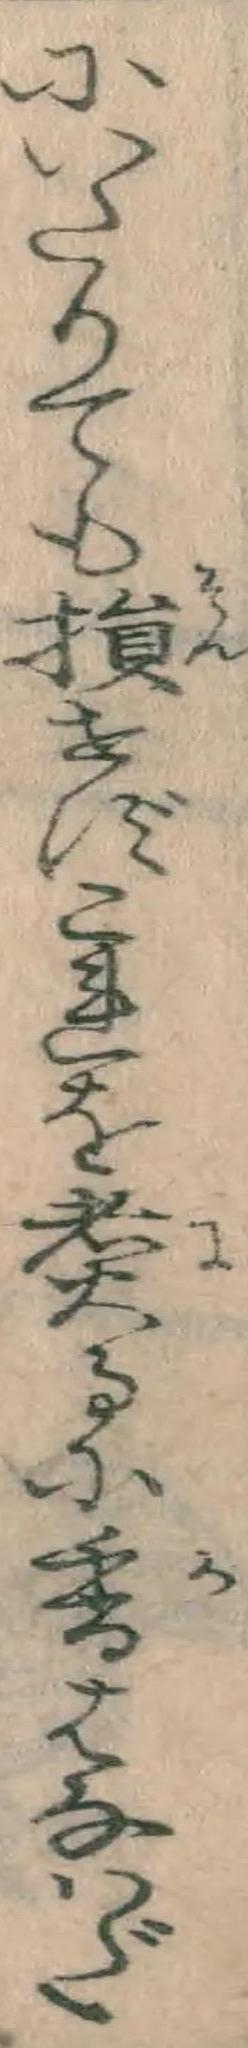にいたりても損せずこれを煮るに香はなはだ
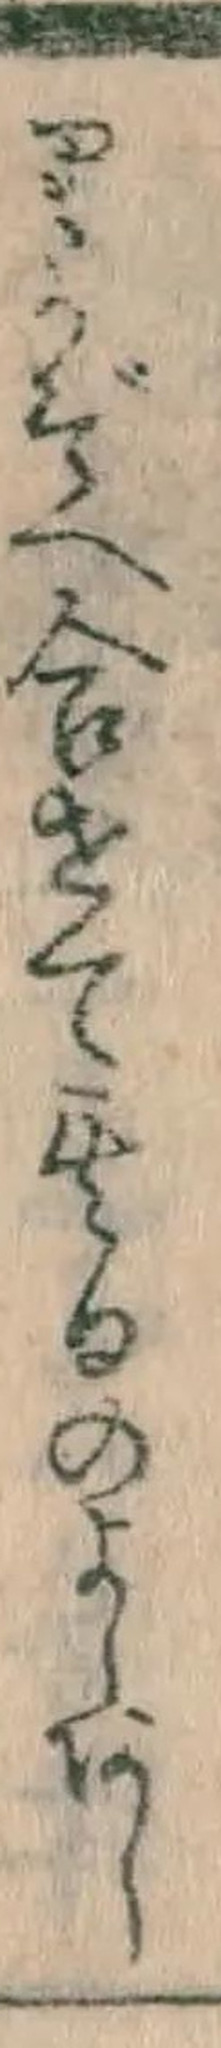りかぞへ合せて其事のよしあし
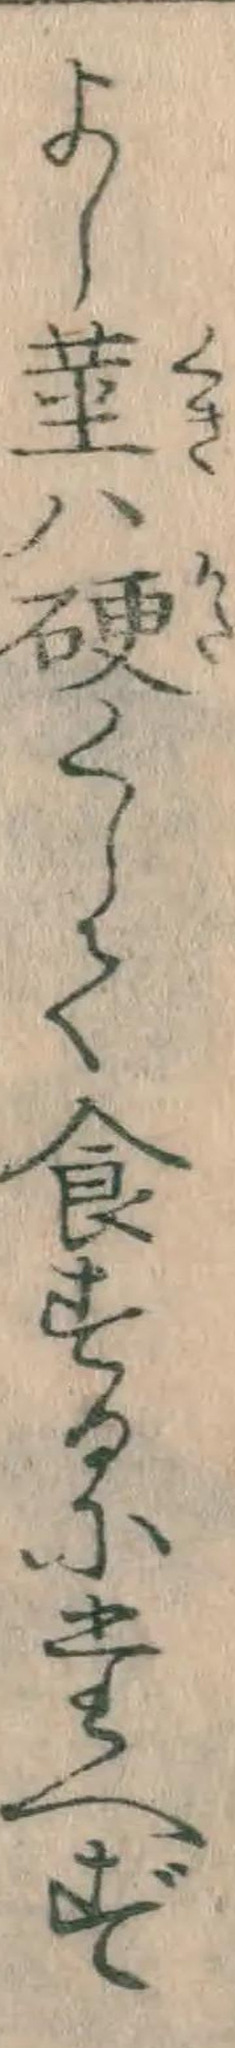よし茎は硬くして食するにたへず
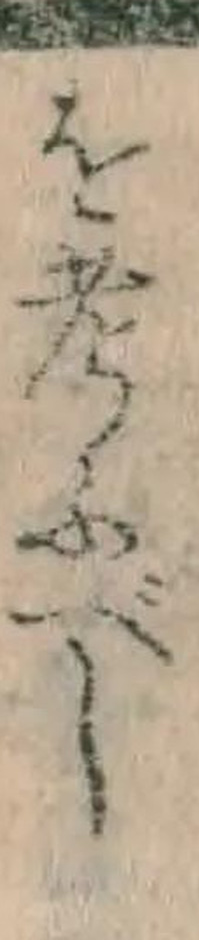を考ふべし
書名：広益秘事大全 3巻. [1]
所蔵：国立国会図書館 National Diet Library, JAPAN
